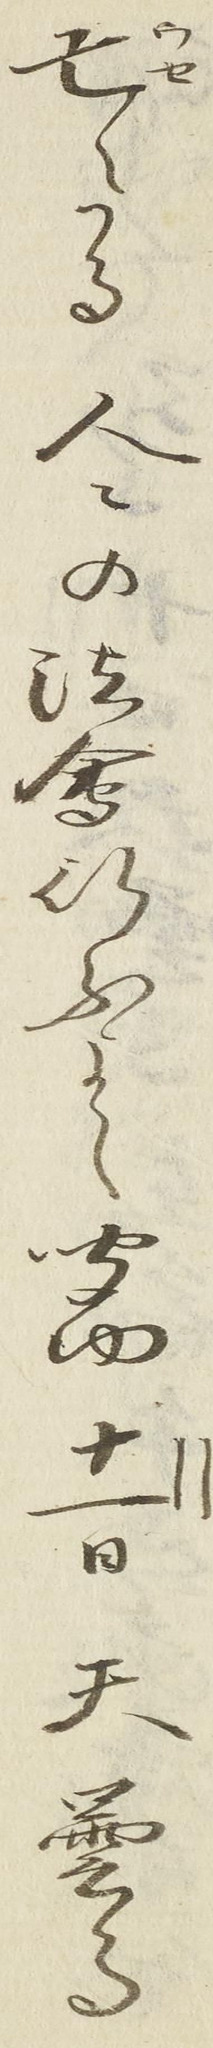亡たる人〻の法会行ふよし聞ゆ十一日天曇る
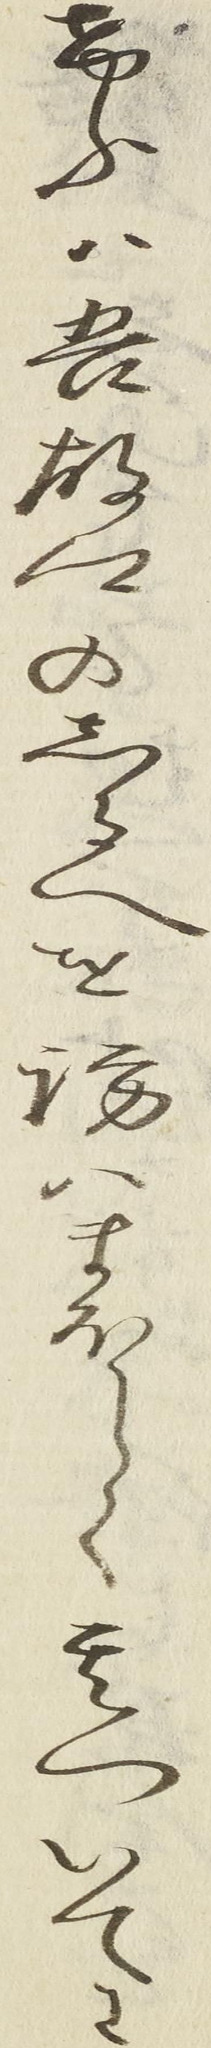けふは吾故郷のしるへを訪はまほしく其ついてに
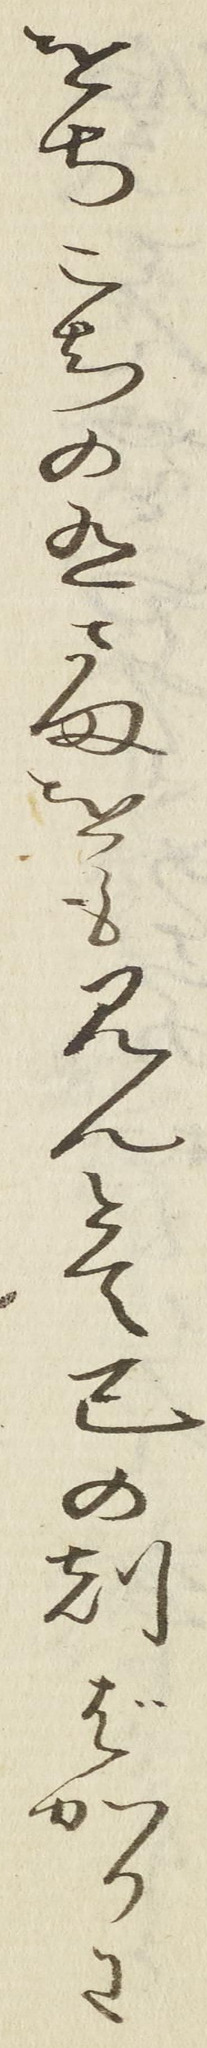をちこちの有さまをも見んとて巳の刻ばかりに
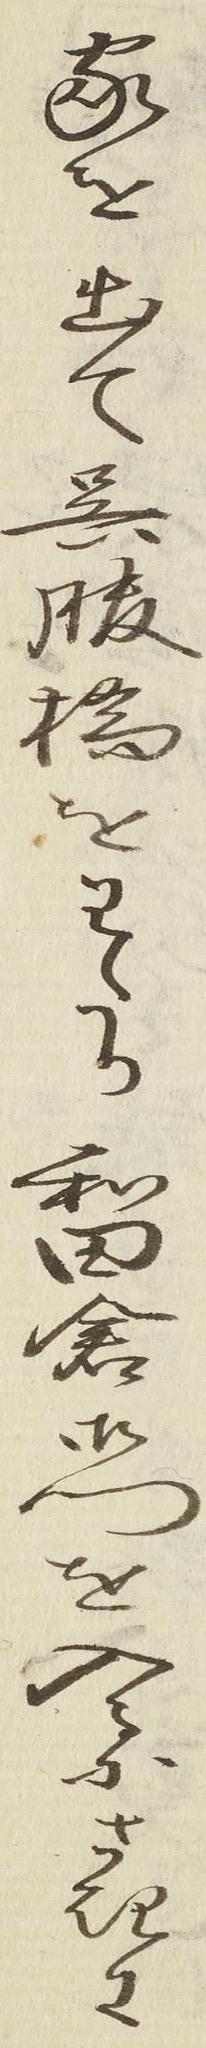家を出て呉服橋をわたり和田倉御門を入るにさきに
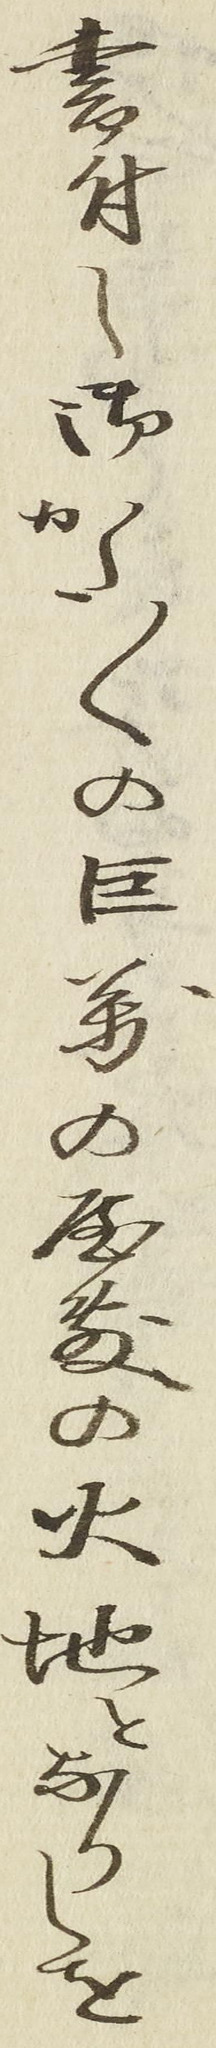書付し御かた〳〵の巨万の屋敷の火地となりしを
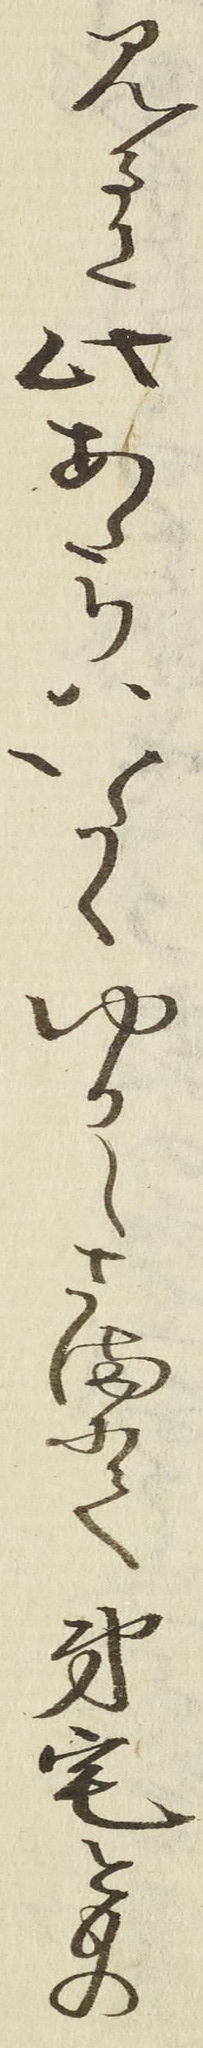見るに此あたりはいたくゆりしさまにて第宅ともの
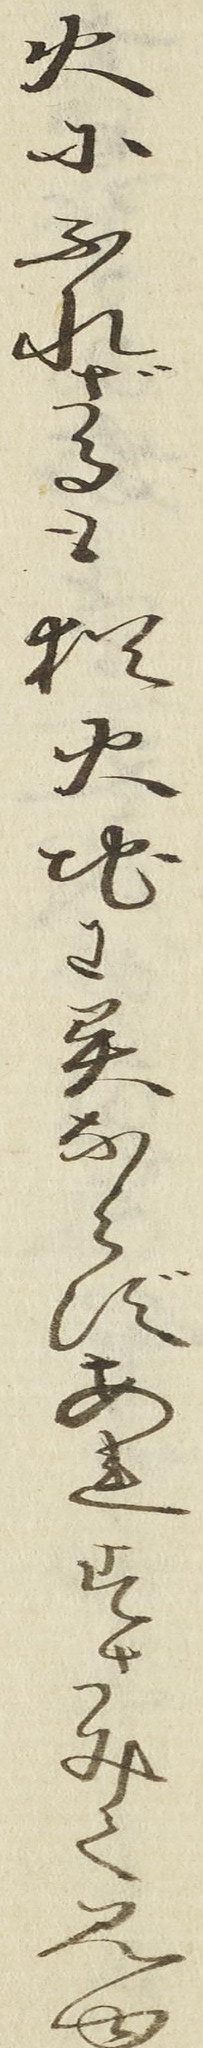火にふれざるも猶火地に異ならずあれすさみて見ゆ
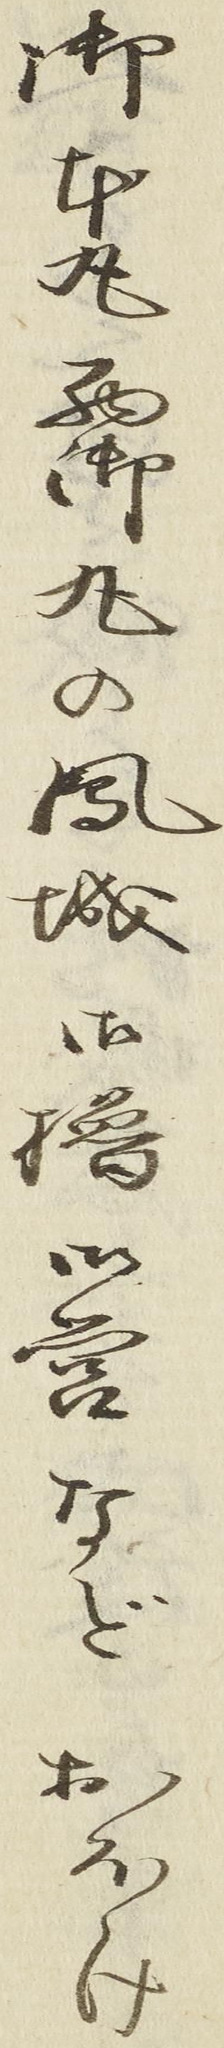御本丸西御丸の鳳城御櫓御営などおほけ
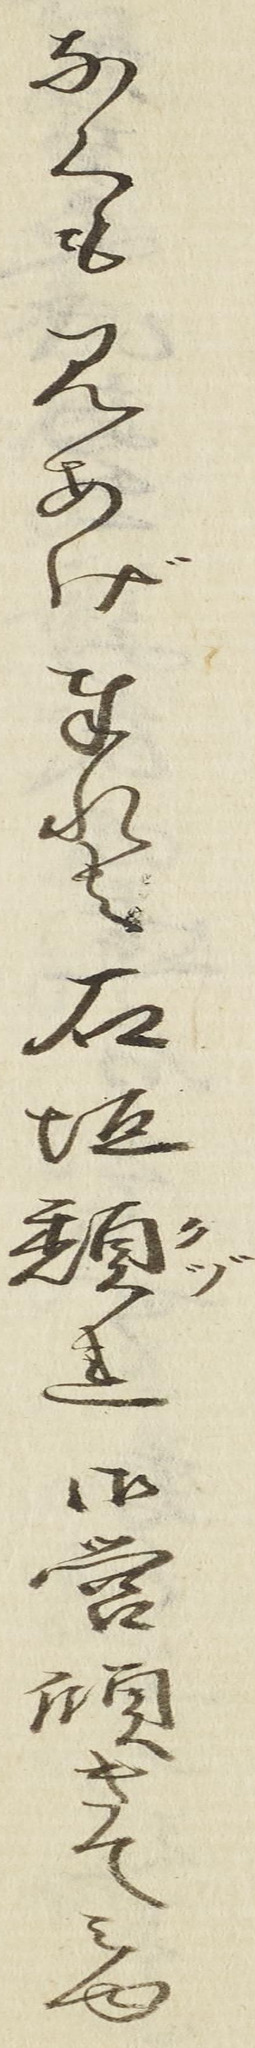なくも見あげ奉れは石垣頽れ御営傾きてみゆ
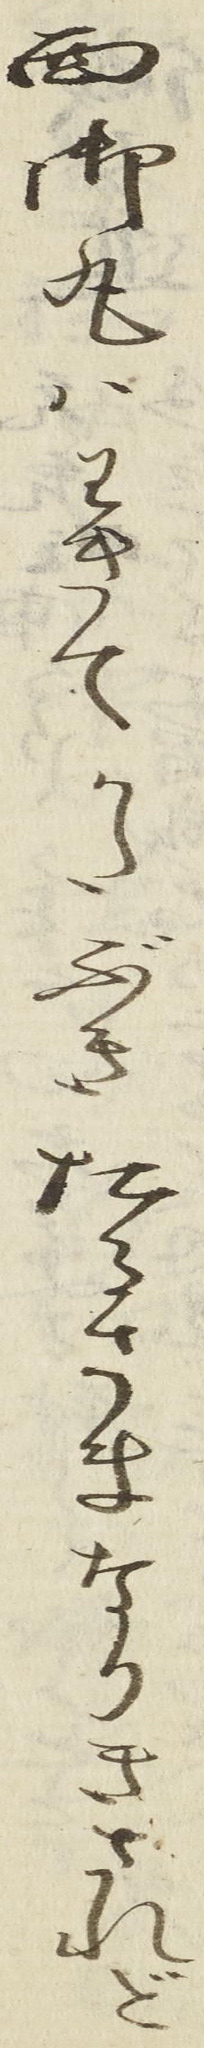西御丸はわきてかたぶきたるさまなりきされど
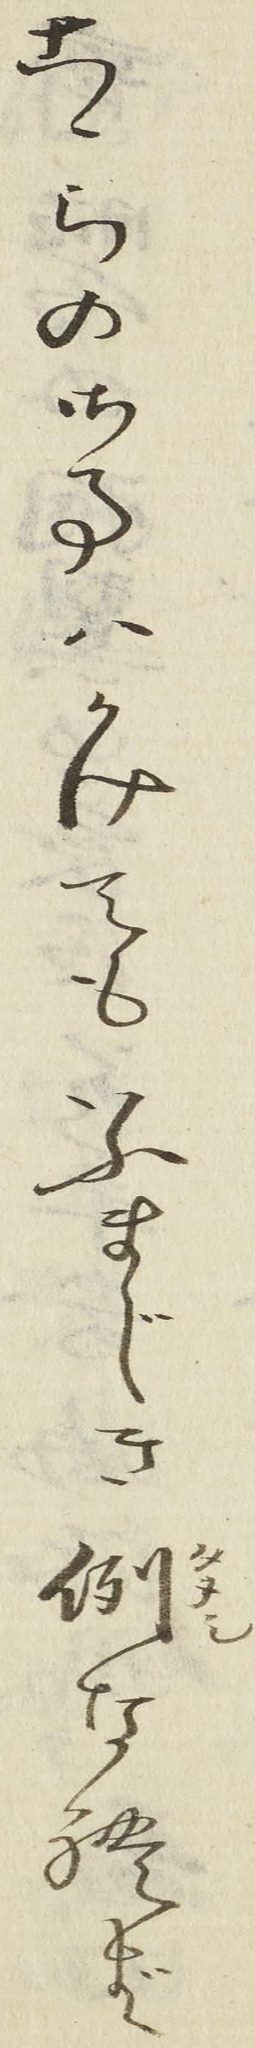こゝらの御事はかけてもいふまじき例なれば
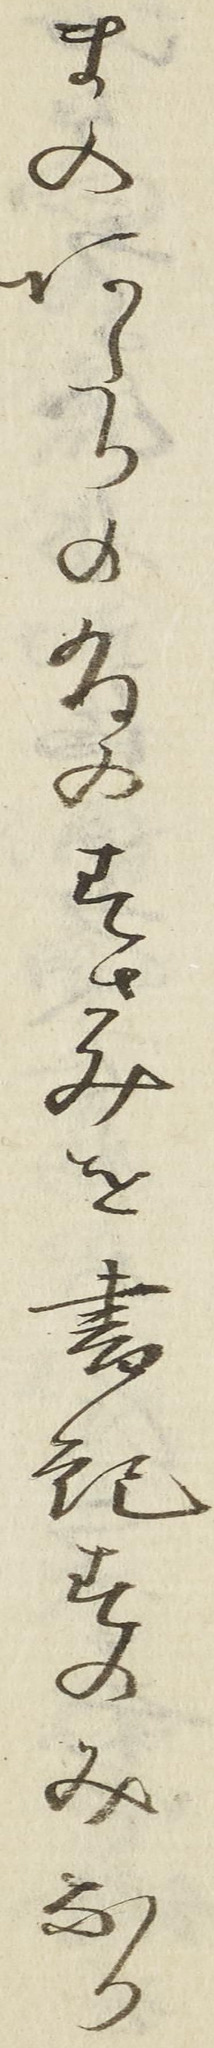まのあたりの有のすさみを書記すのみなり
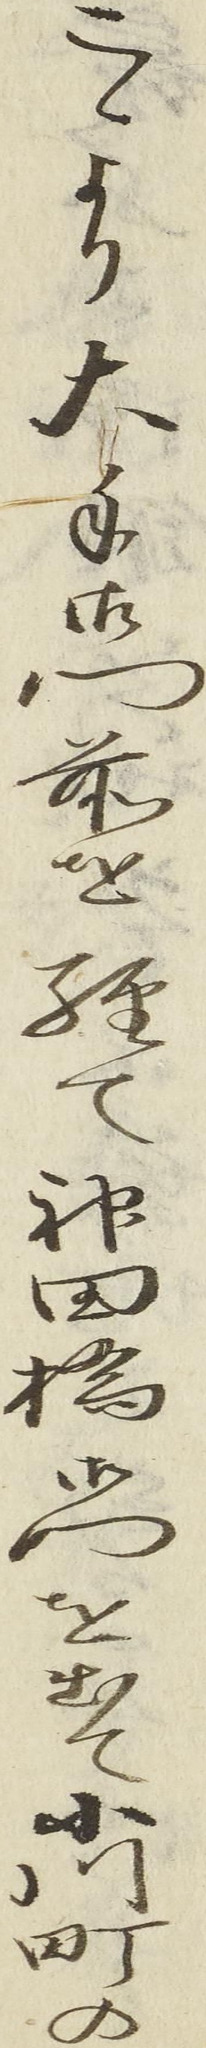こゝより大手御門前を経て神田橋御門を出て小川町の
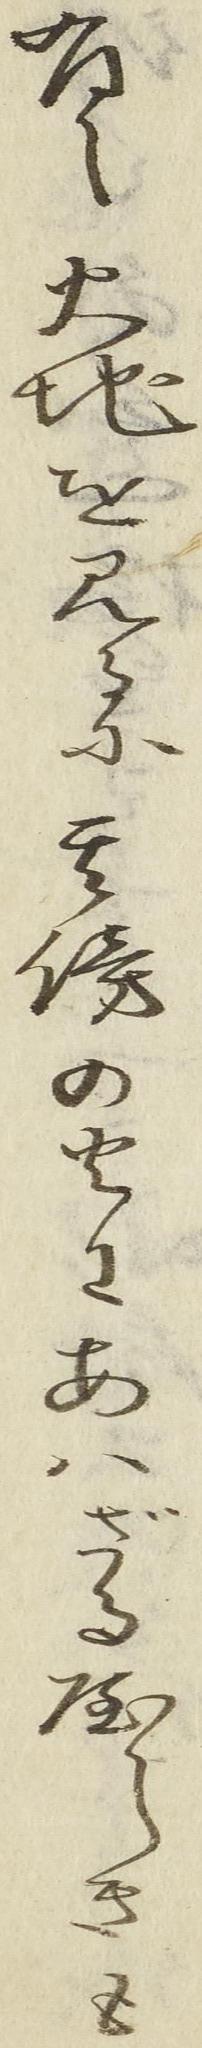有し火地を見るに其傍の火にあはざる屋しきも
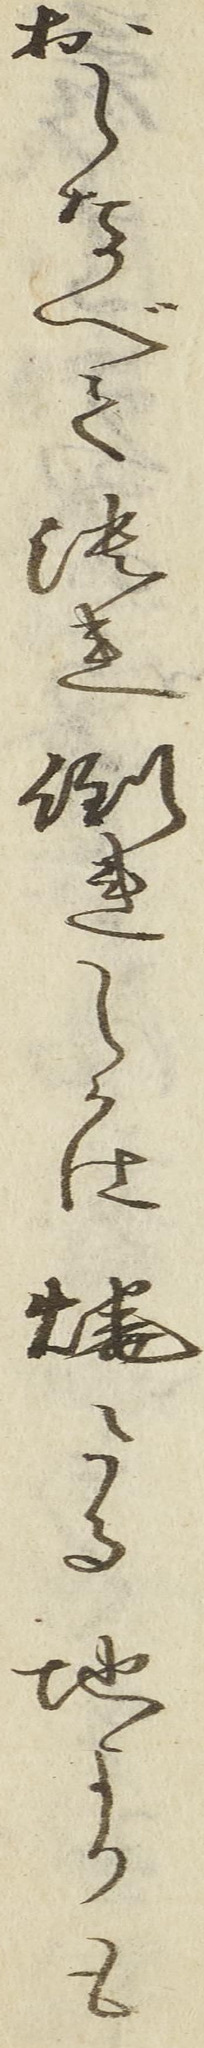おしなべて潰れ倒れしかは焼たる地よりも

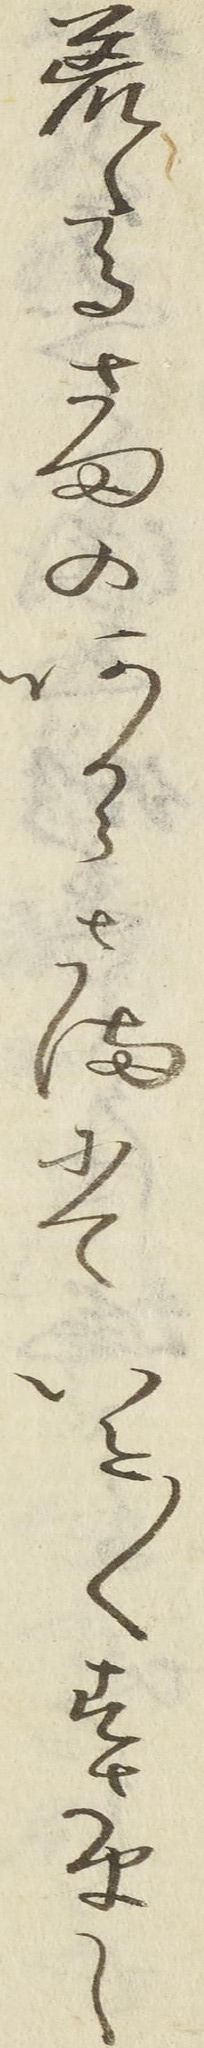荒たるさまのあからさまにていと〳〵すさまし
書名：やぶれ窓の記　全
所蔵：東京大学地震研究所図書室 Earthquake Research Institute Library, The University of Tokyo, JAPAN
